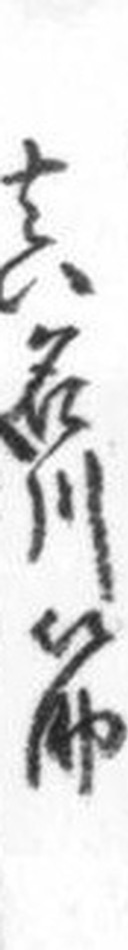真名川筋
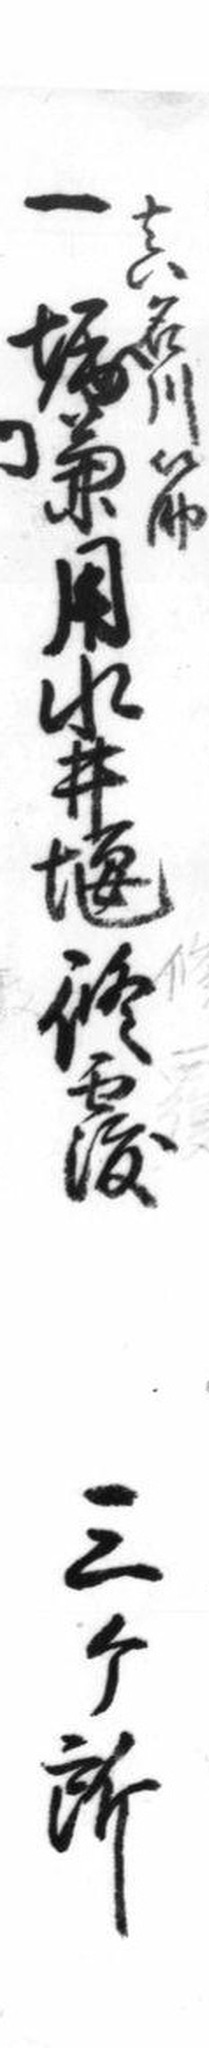一堀兼用水井堰修覆三ヶ所
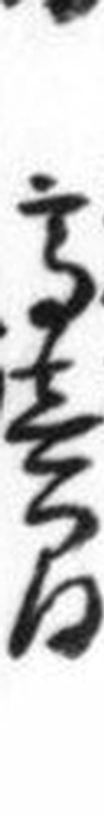高壱間
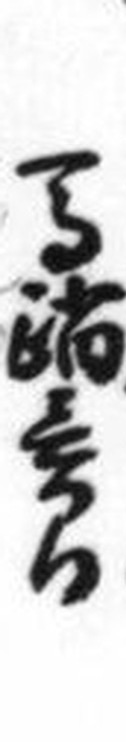馬踏壱間
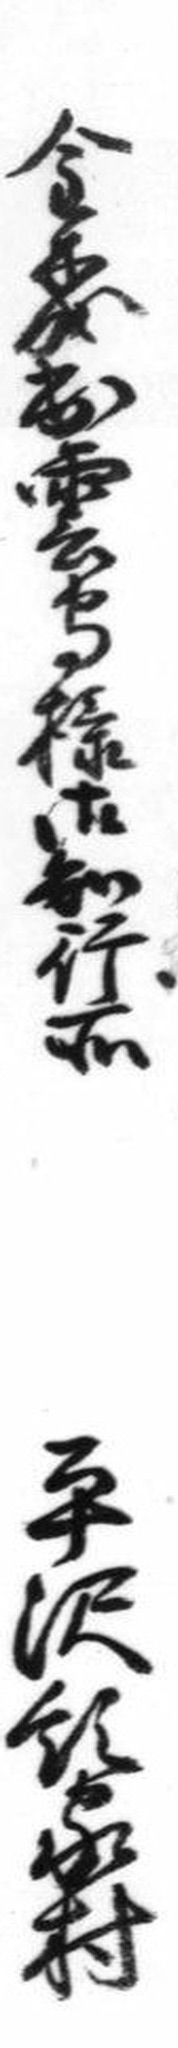金森出雲守様御知行所平沢領家村
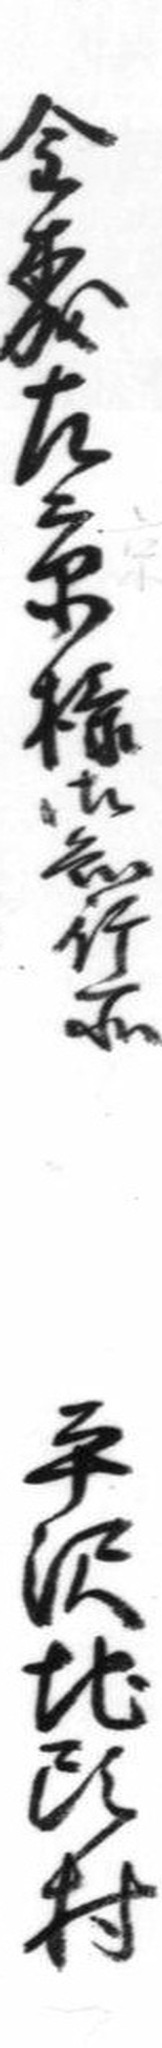金森左京様御知行所平沢地頭村
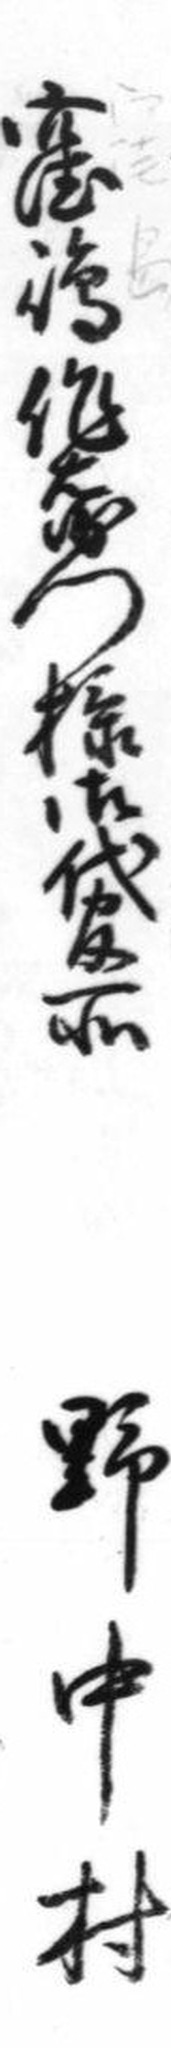窪嶋作右衛門様御代官所野中村
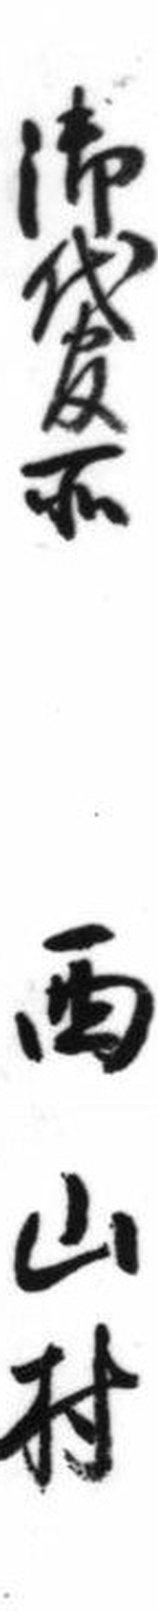同御代官所西山村
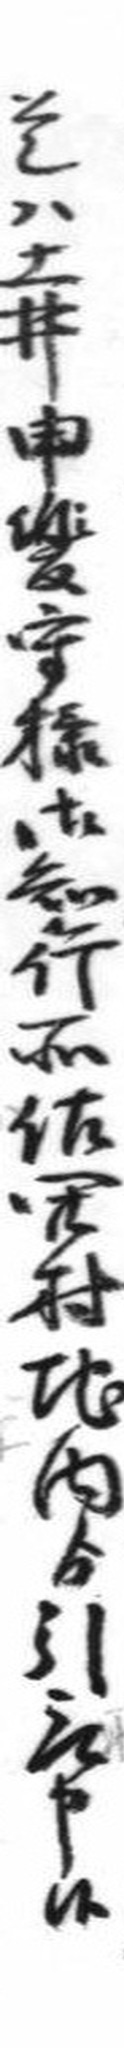是ハ土井甲斐守様御知行所佐開村地内より又引取申候
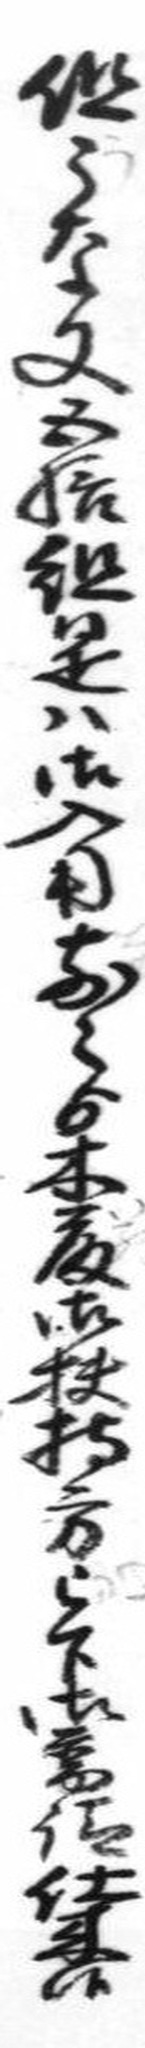但うな又五拾組是ハ御入用前々より木藤御扶持方被下御普請仕来候
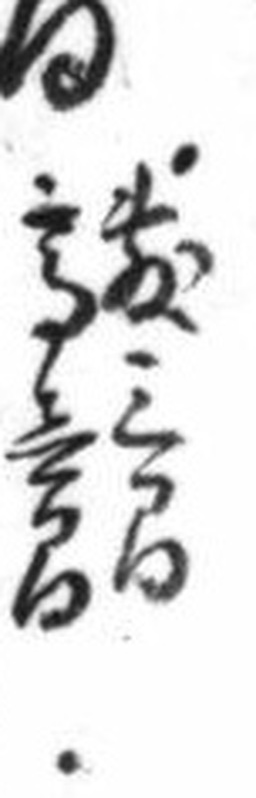高壱間
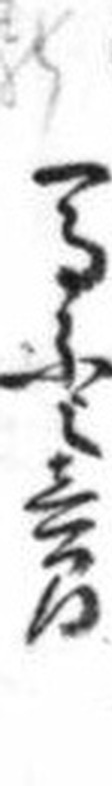馬ふみ壱間
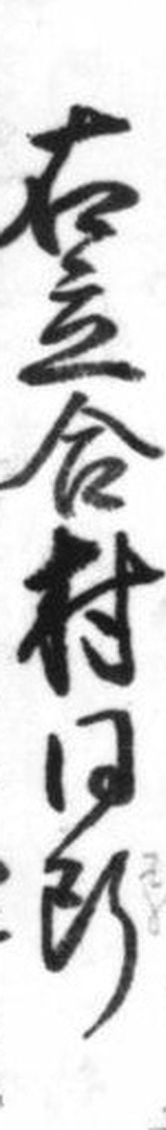右立合村同断
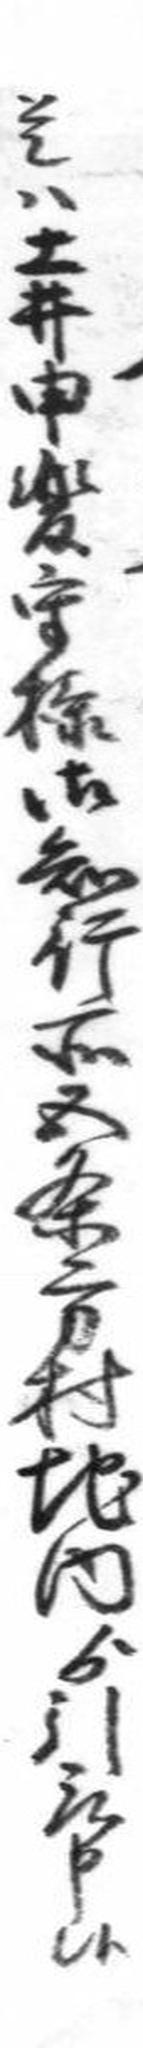是ハ土井甲斐守様御知行所五条方村地内より引取申候
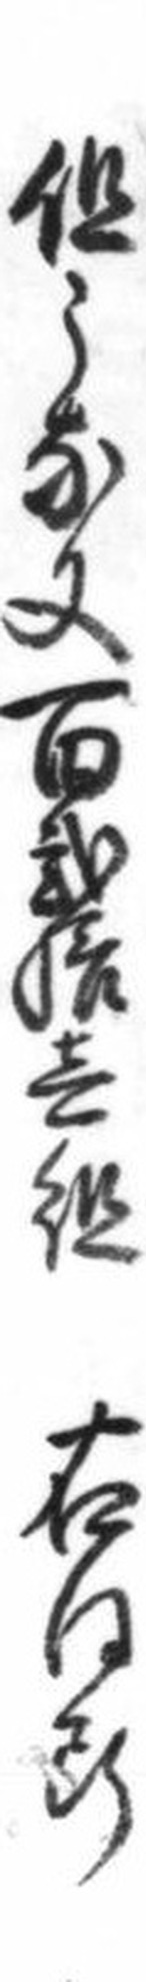但うな又百弐捨壱組右同断
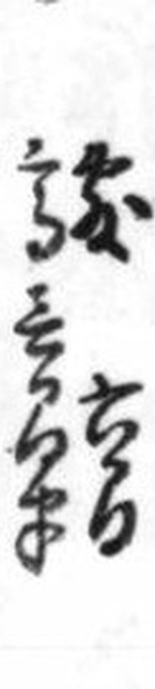高壱間半
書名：越前国大野郡今井村明細帳
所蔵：福井県文書館 Fukui Prefectural Archives
